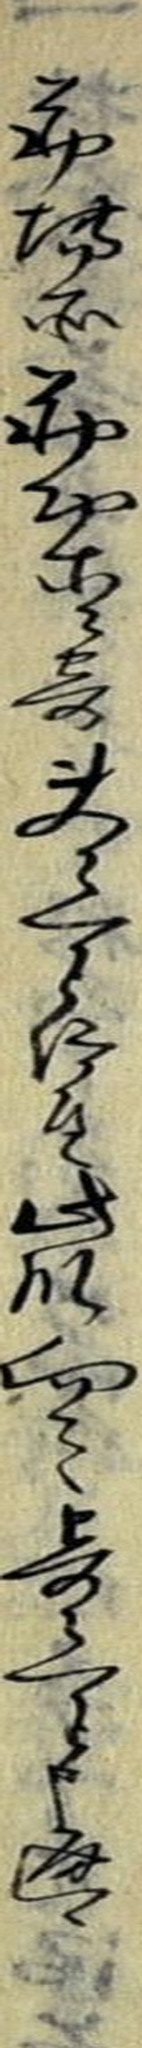勤場所勤功等に寄夫々可被仰付候此段向々之寄に可被申通候
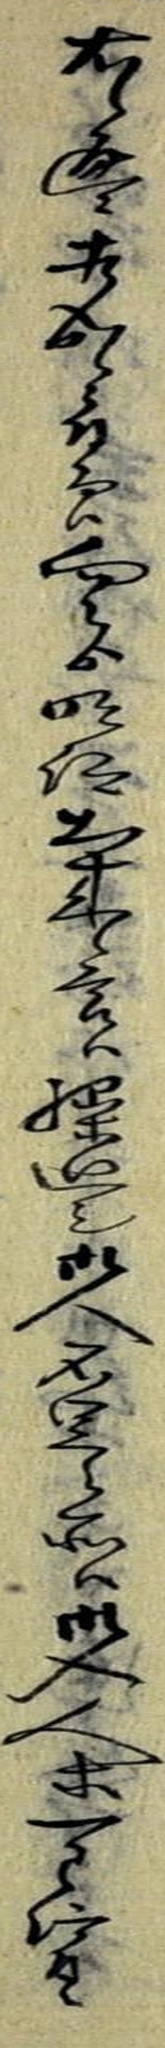一右之通に相成候に付而は向々ゟ明跡出来候節は繰廻し御人不足之所は御入人等可被仰付候
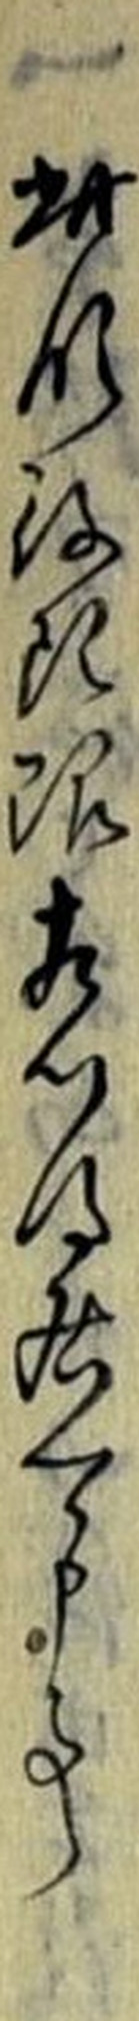此段役頭限相心得居可申事
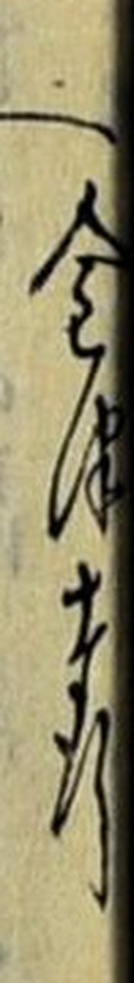金津奉行
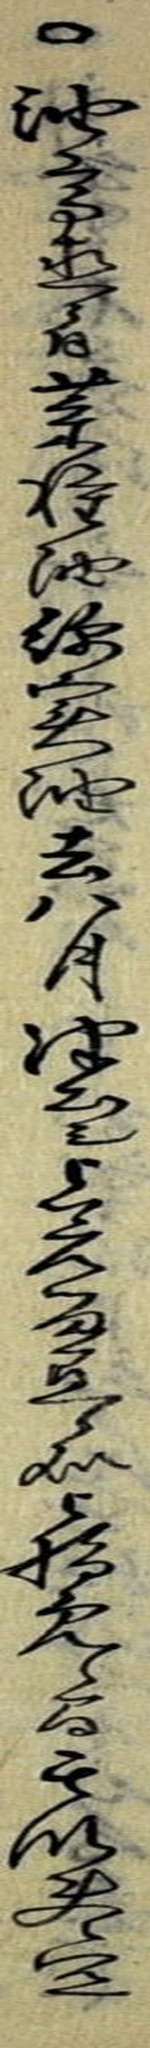○油高直に付菜種油綿実油去八月津出し差留置候処被指免候間其段夫々宜
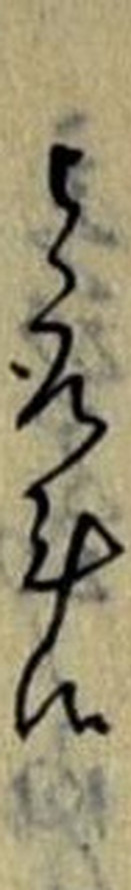被取斗候
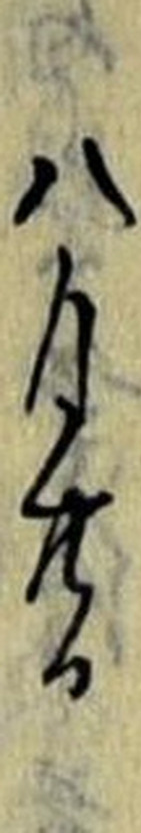八月廿日
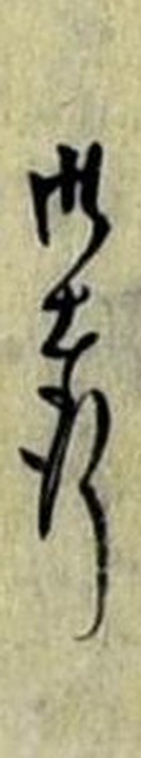御奉行
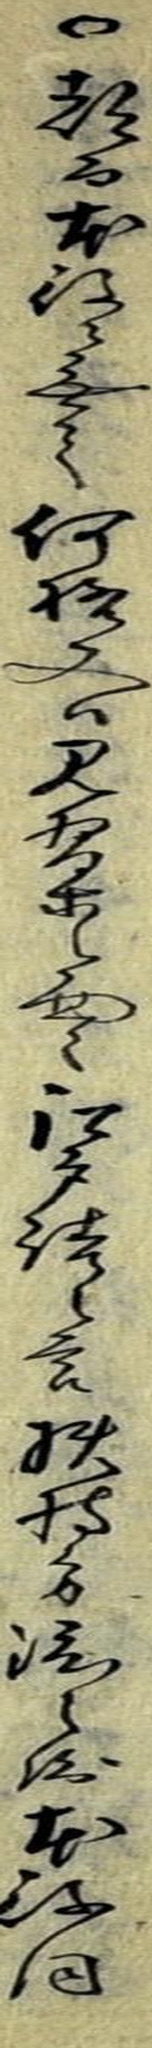○都而本役に無之何格又は見習等之面々江戸詰之節扶持方渡之儀本役同
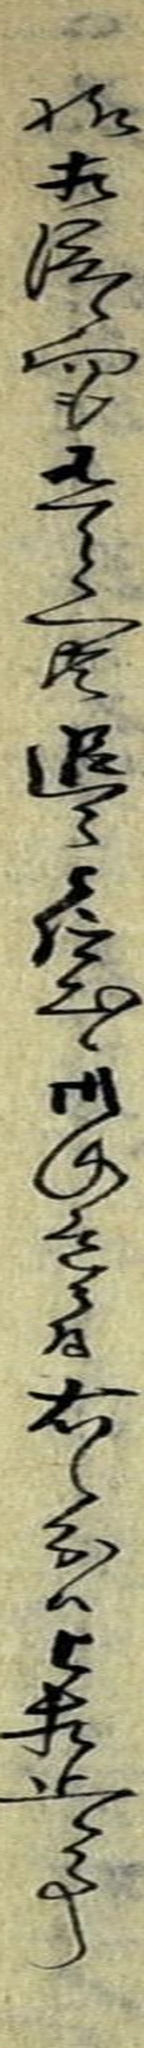様相渡候向も有之候へ共追々被仰出候御趣意に付右之分は被相止候事
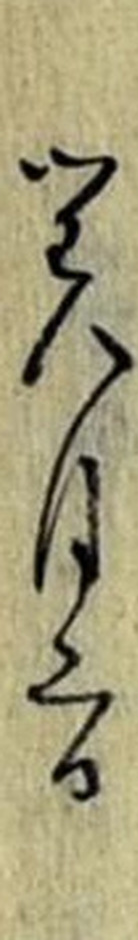閏八月二日
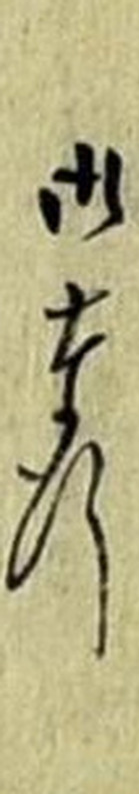御奉行
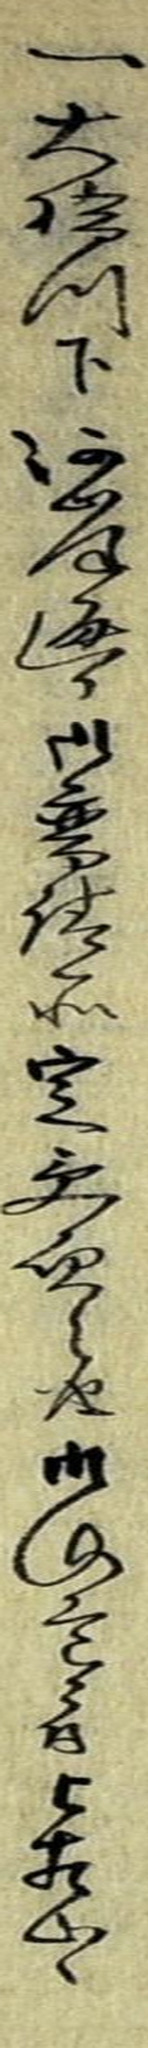一大橋川下海岸通り御普請所定受負之儀御趣意に付被相止候
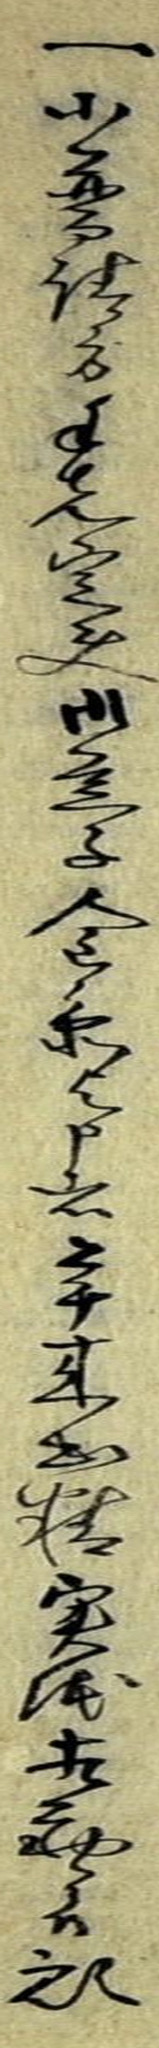一小普請方手先定夫御荒子金兵衛と申者年來出精実体相勤候に付願
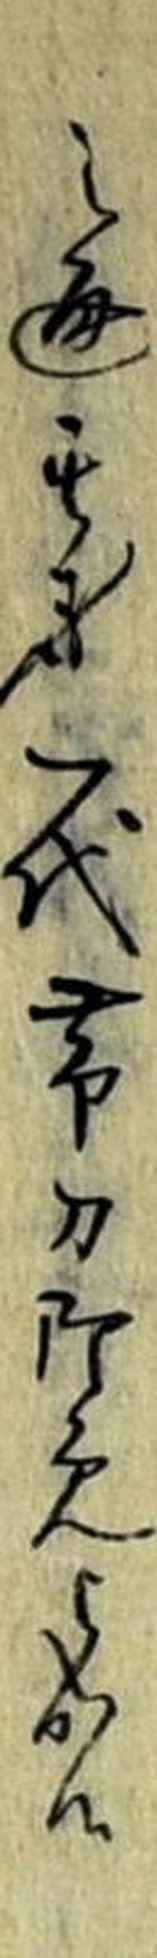之通其身一代帯刀御免被成候
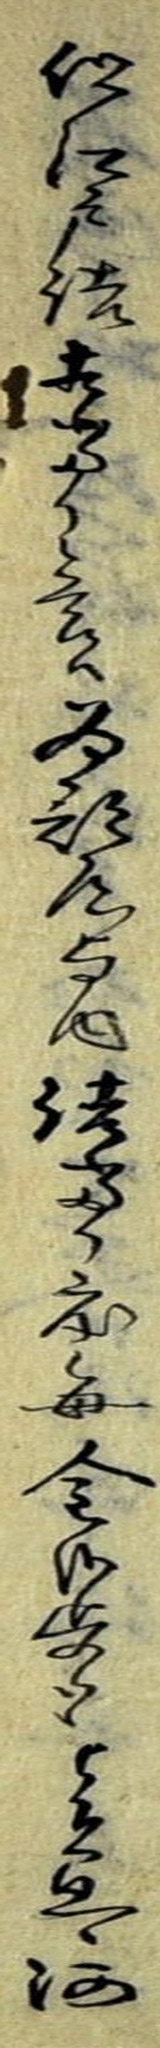但江戸詰相当り候節は為部屋与内詰当り度毎金弐分つヽ被下置候海
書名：命令之部 四
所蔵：福井県文書館 Fukui Prefectural Archives
